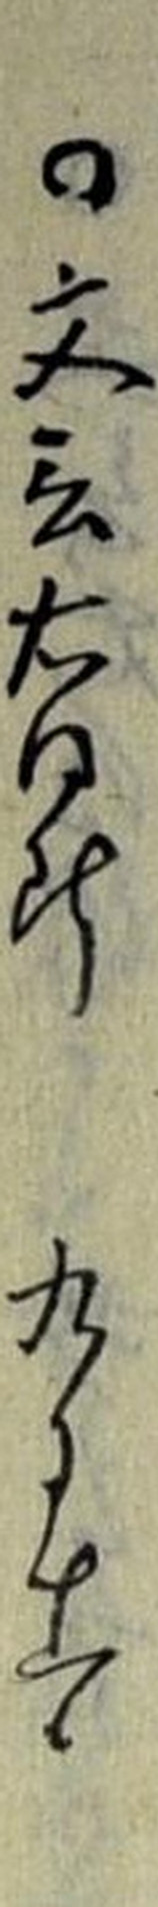〇文言右同断九月十一日
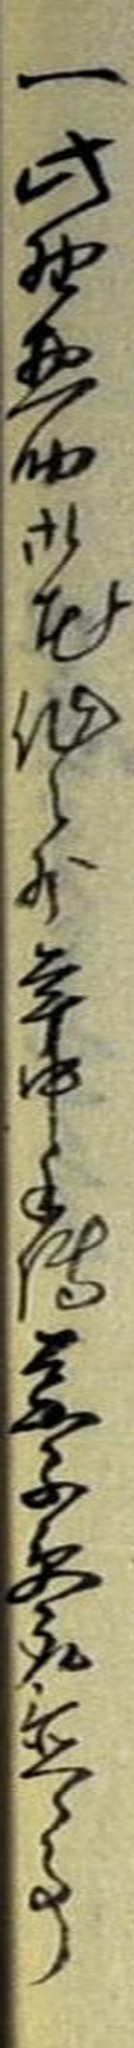一此野惣助御花作之外年中手伝荒子受取置候事
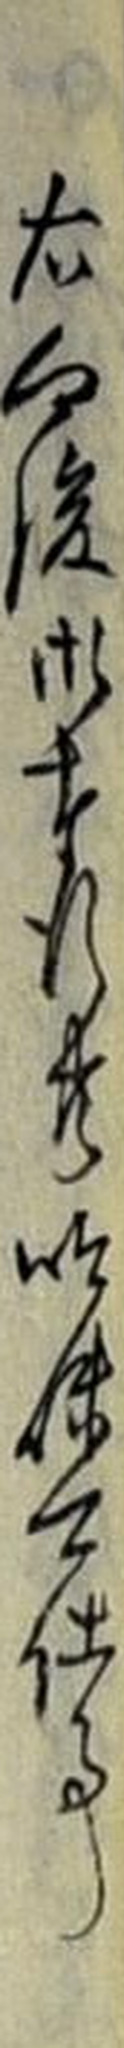右向後御奉行共吟味可仕事
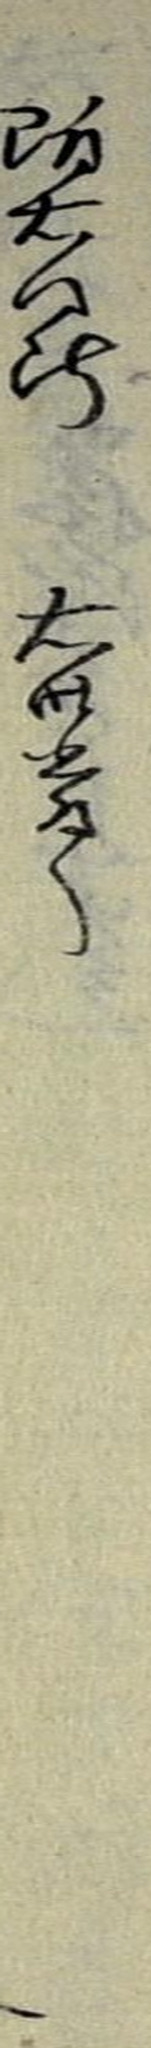附右同断右之御書付之
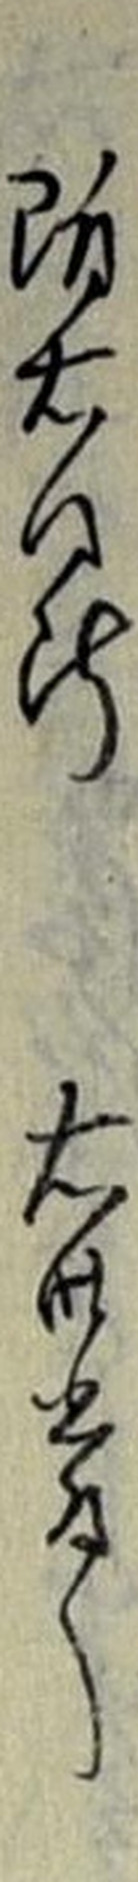附右同断右之御書付之
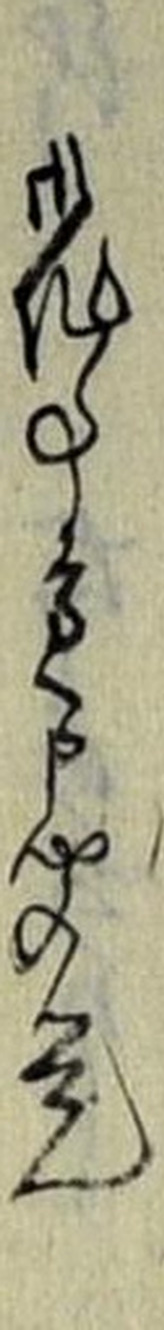御作事方へ申聞覚
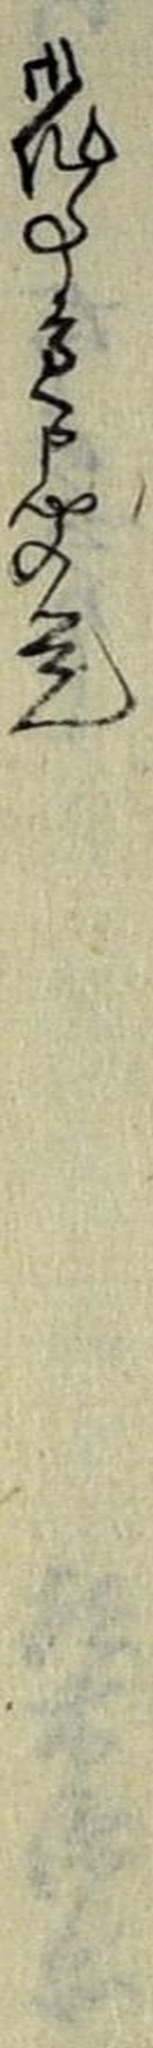御作事方へ申聞覚
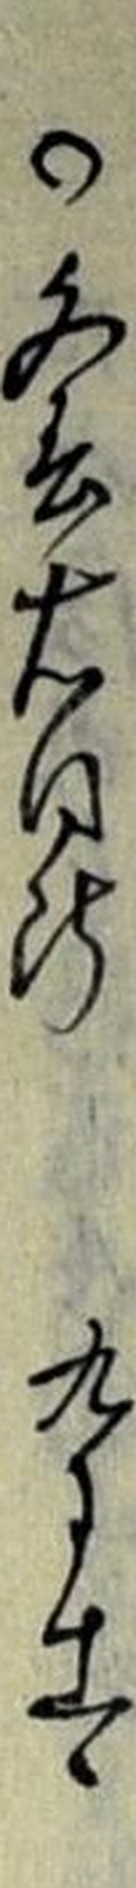〇文言右同断九月十一日
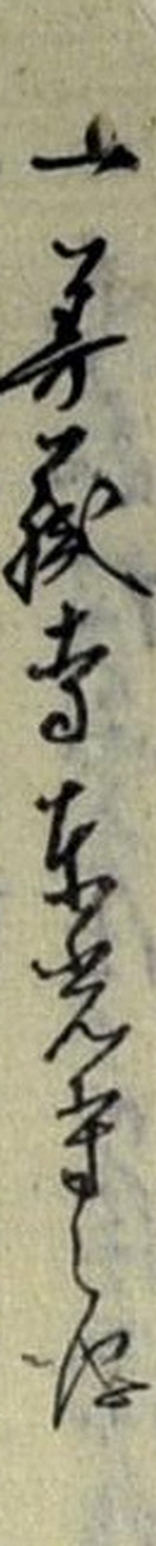一華蔵寺東光寺之儀
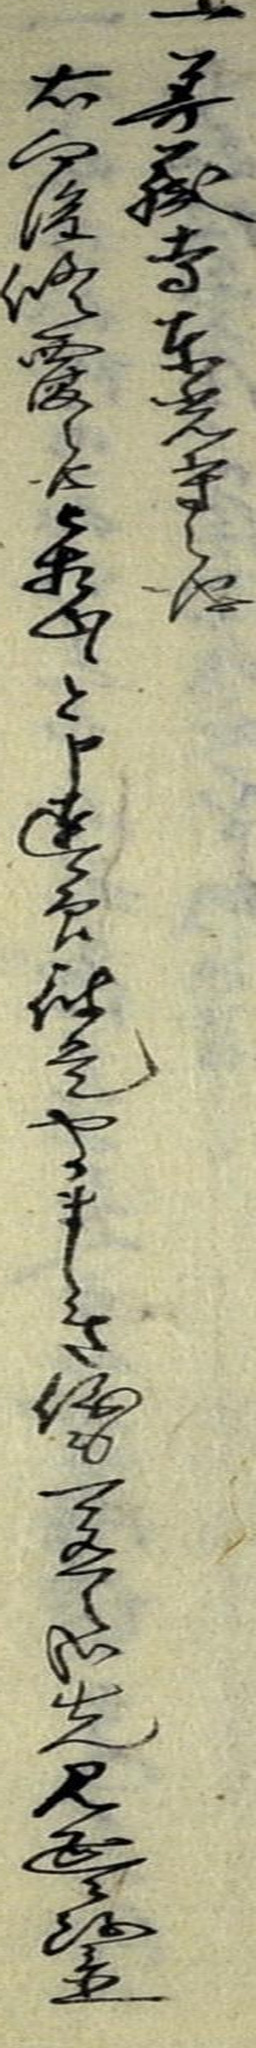右向後修覆之儀被相止候と申達候而ハ彼是やかましき儀も可有之哉先見延ニ致置
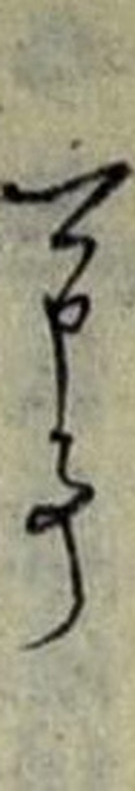可申事
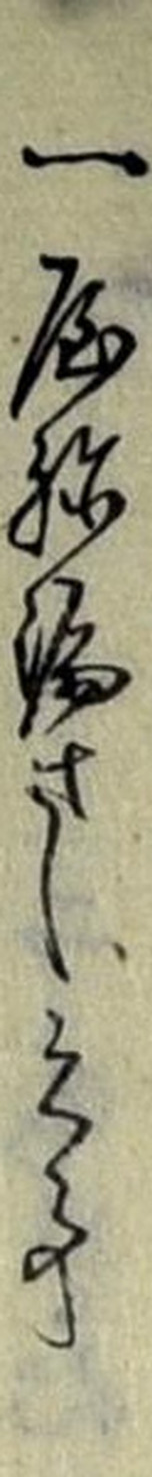一やね漏さし之事
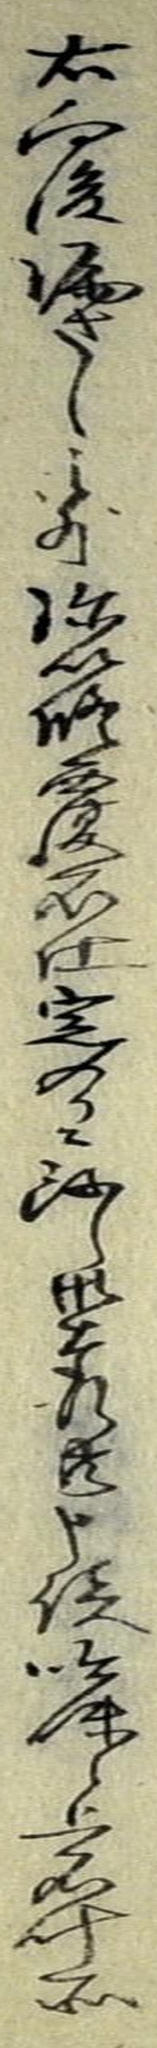右向後漏さし之外弥以修覆不仕定〆りニ致し御奉行共申談吟味之上不叶所
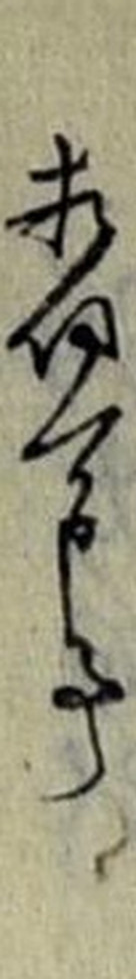相伺可申事
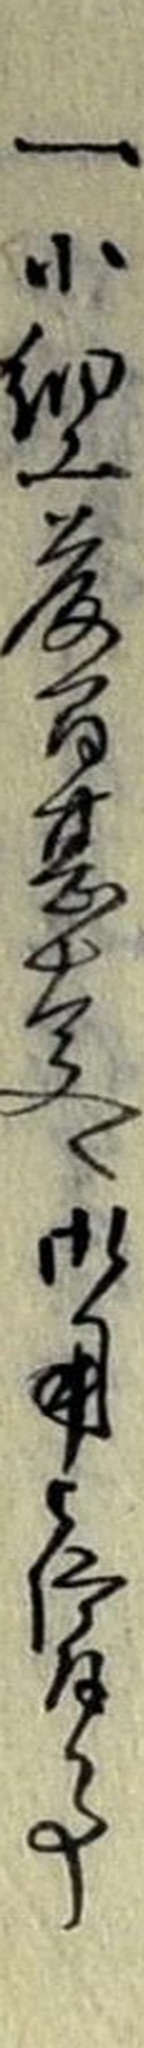一小細工藤間甚大夫へ御用被仰付事
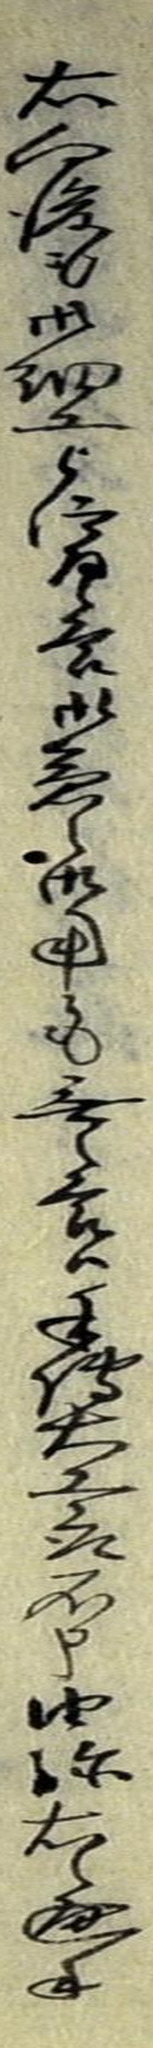右向後も御細工被仰付候節御急之御用ニも無之節ハ手伝大工取不申由弥右之通手
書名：命令之部 一
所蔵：福井県文書館 Fukui Prefectural Archives
